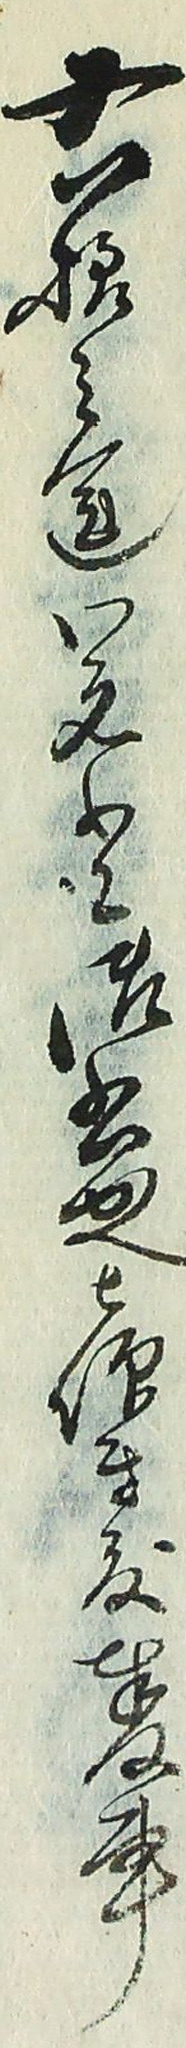右様之運御文書に御書加へ被仰付度奉存事
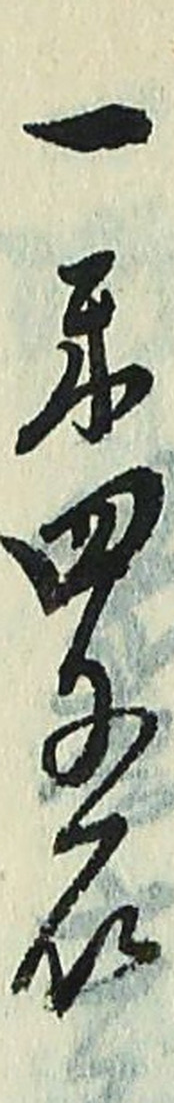一米四千石
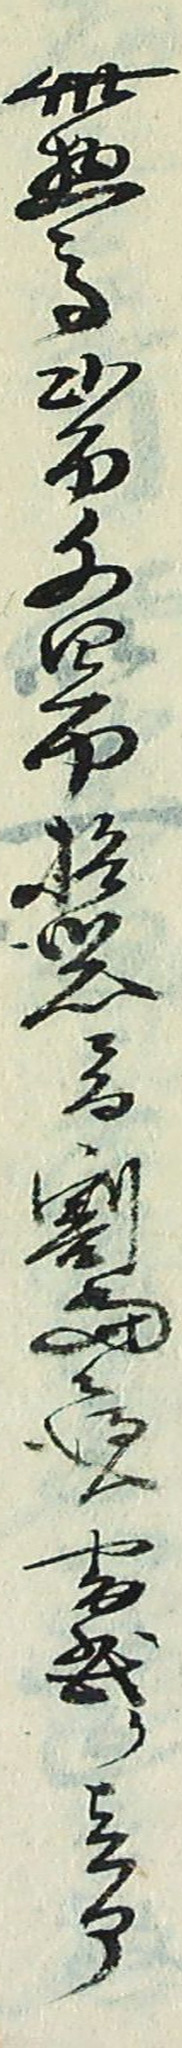此惣高弐万千四百拾弐石ニ而割當候得ハ歩當り壱分
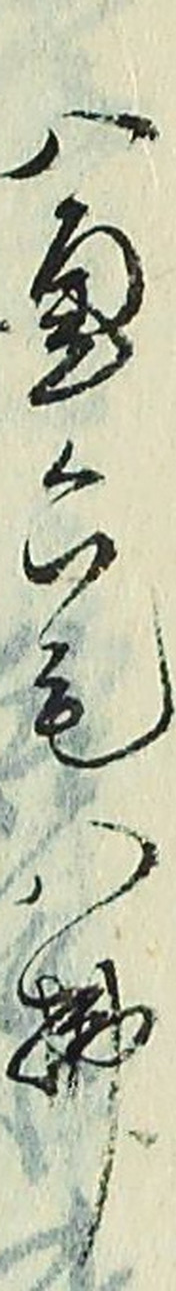八厘六毛八拂
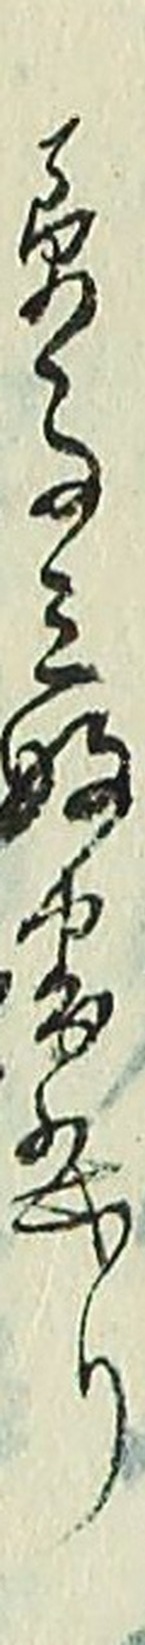美馬三好歩當り
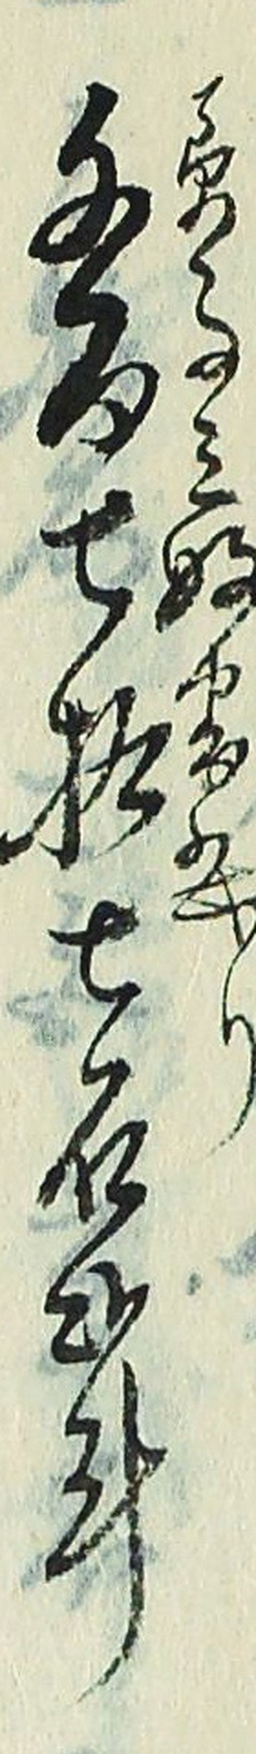千百七拾七石弐斗
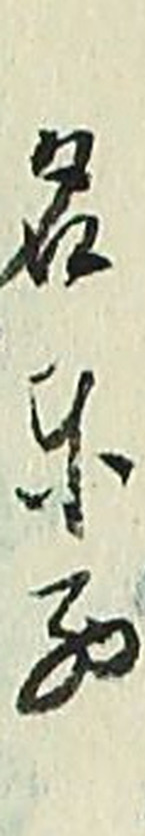名東西
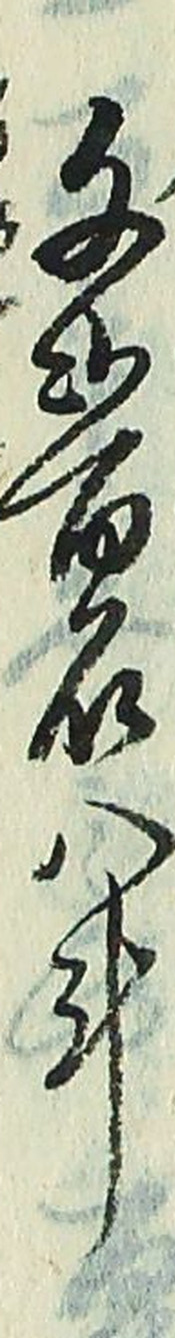千弐百石八斗
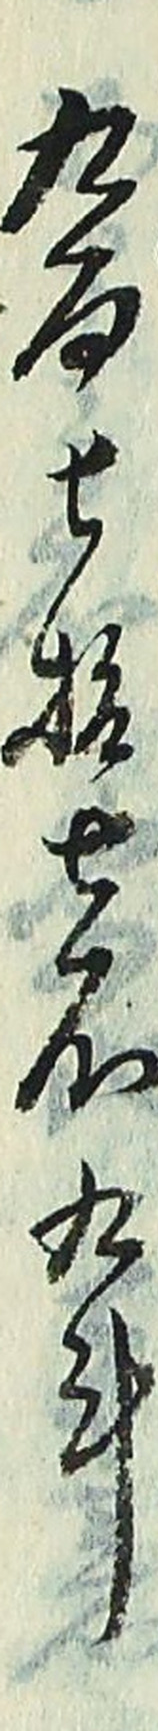九百七拾七石九斗
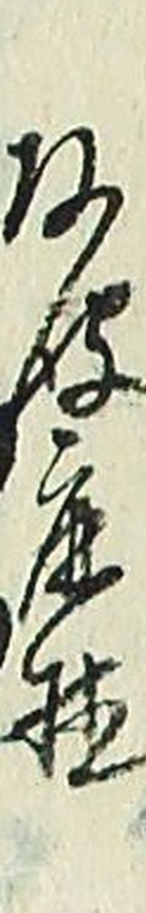阿波麻植
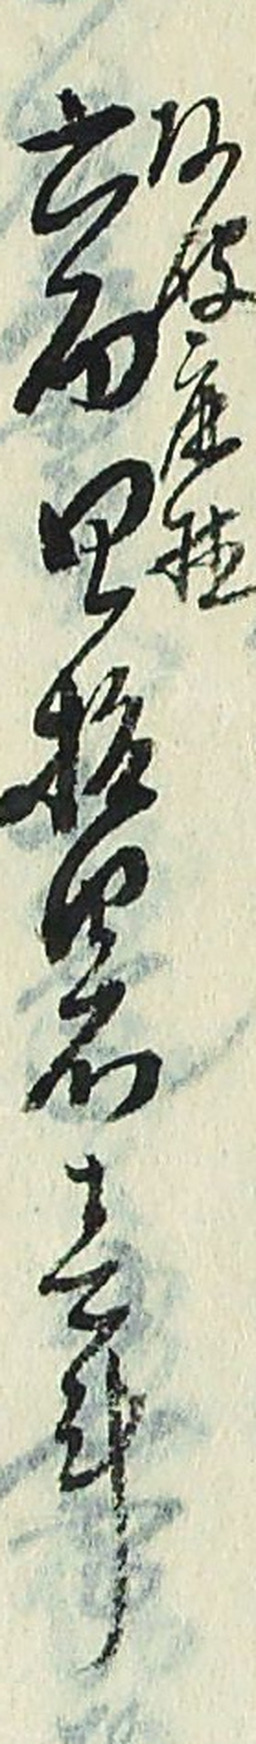六百四拾四石壱斗
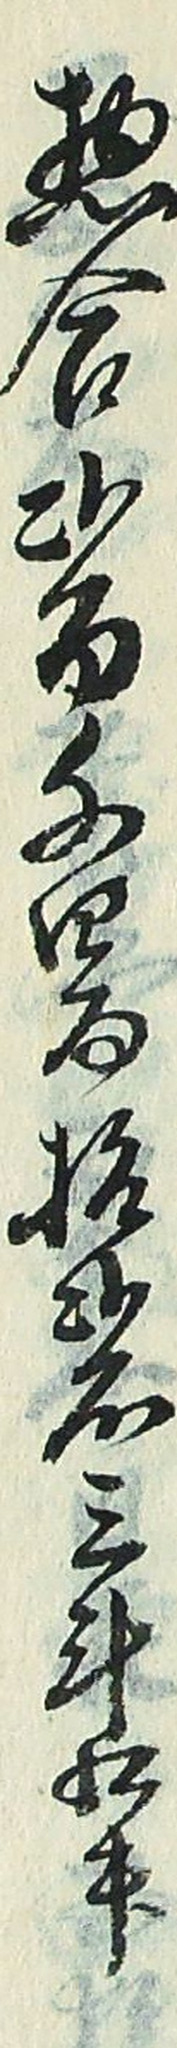惣合弐万千四百拾弐石三斗九升
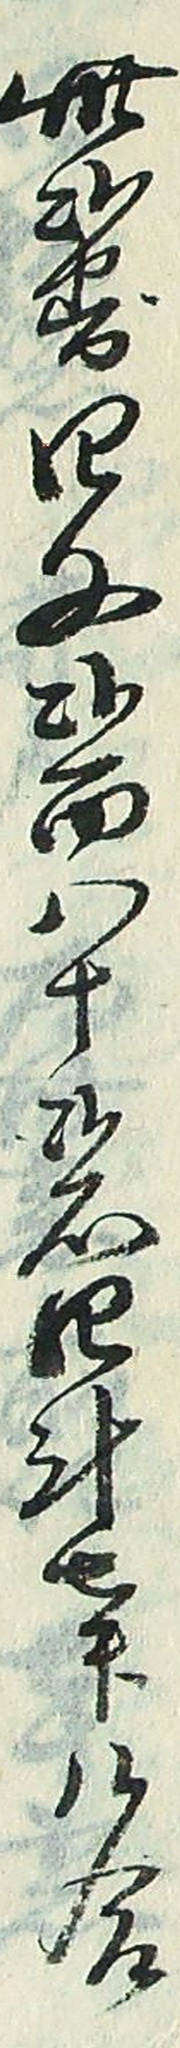此弐歩四千弐百八十弐石四斗七升八合

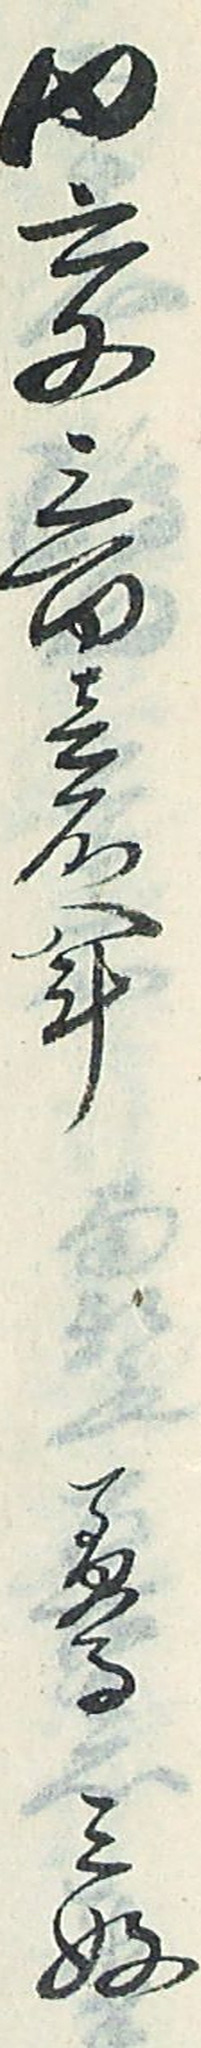内六千三百壱石八斗美馬三好
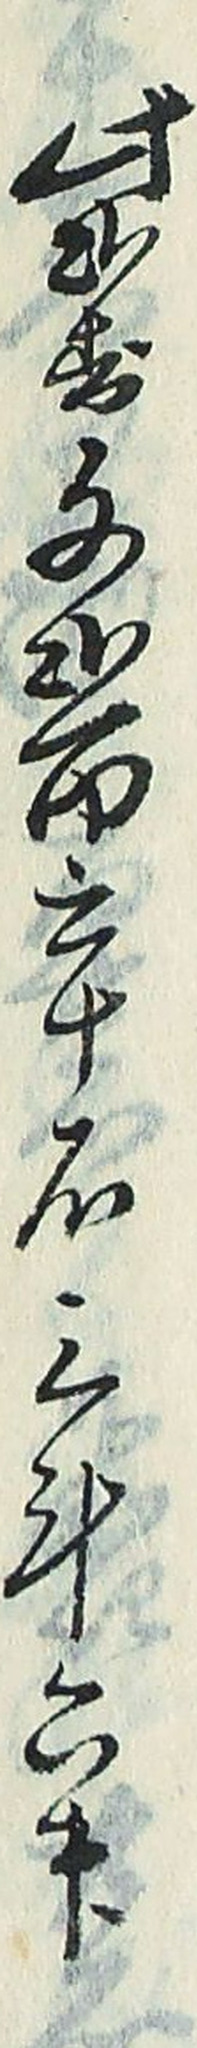此弐歩千弐百六十石三斗六升
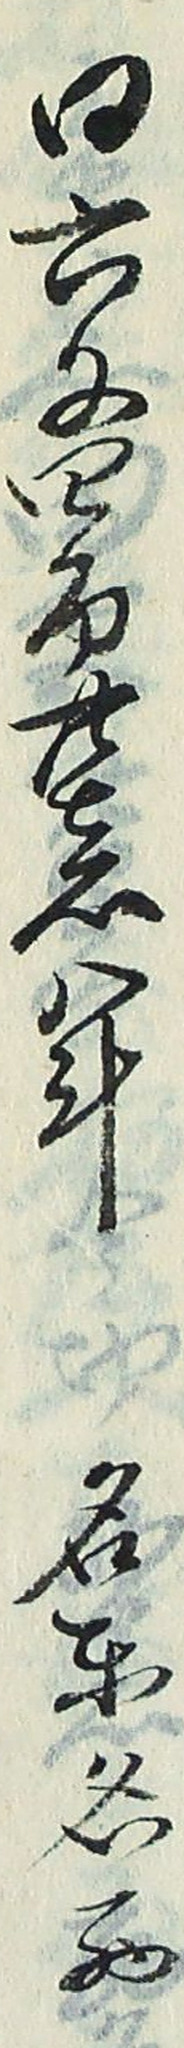同六千四百廿七石八斗名東名西
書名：諸御趣意書并御下知向之写
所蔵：鳴門教育大学 Naruto University of Education
